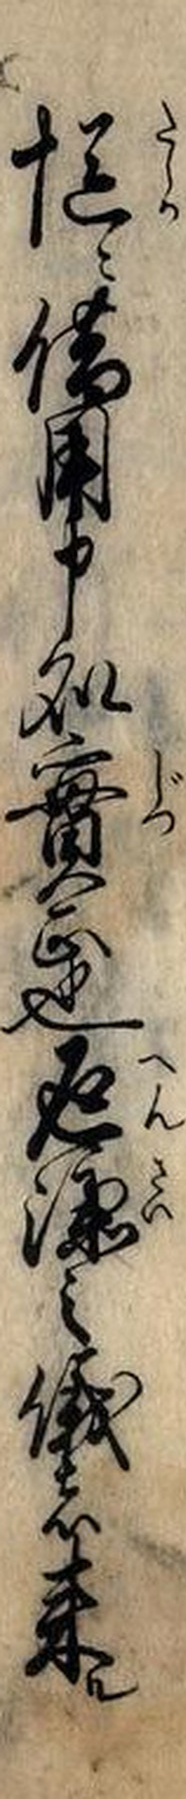慥に借用申処實正也返済之儀者来ル
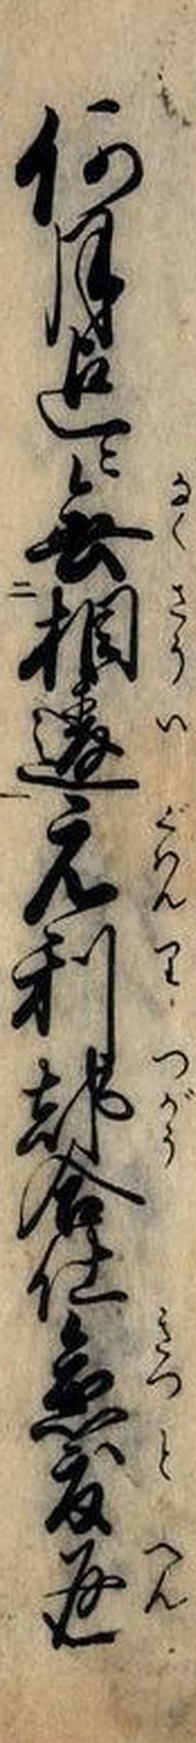何月迄に無相違元利都合仕急度返
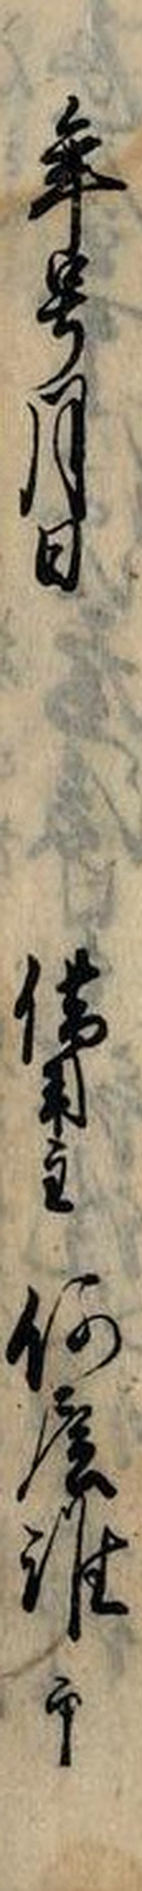年号月日借用主何屋誰印
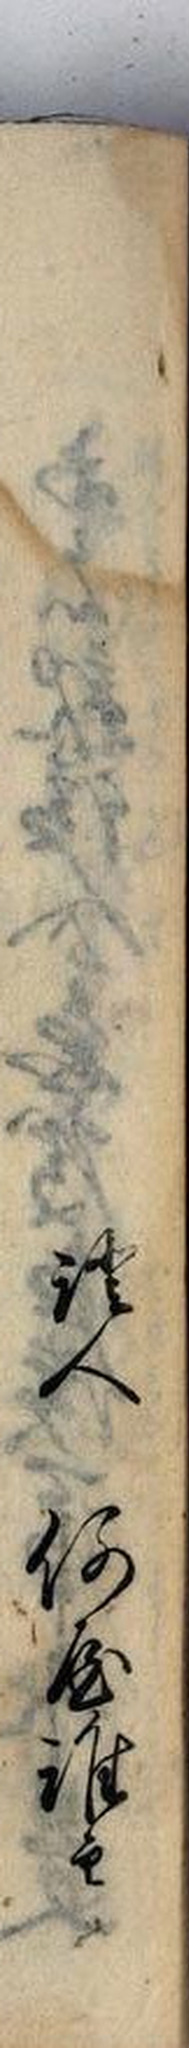證人何屋誰印
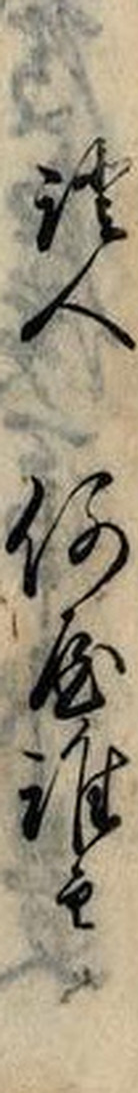證人何屋誰印
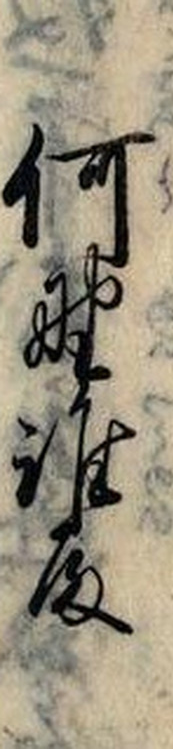何野誰殿
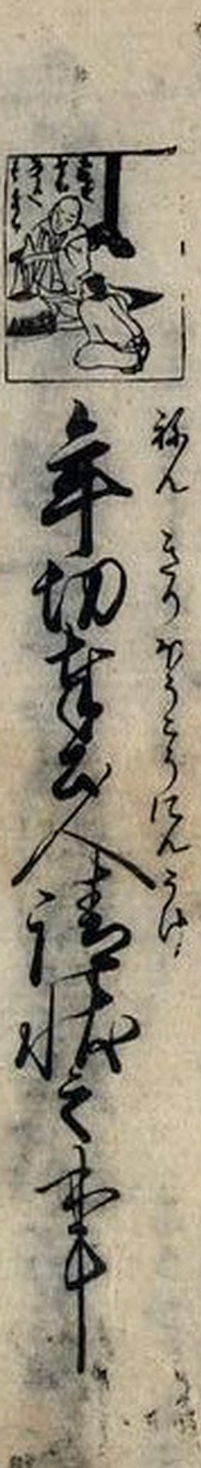年切奉公人請状之事
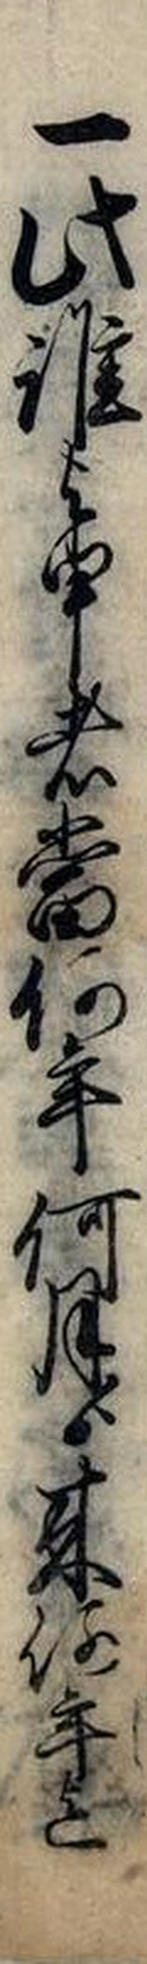一此誰与申者當何年何月ゟ来何年迄

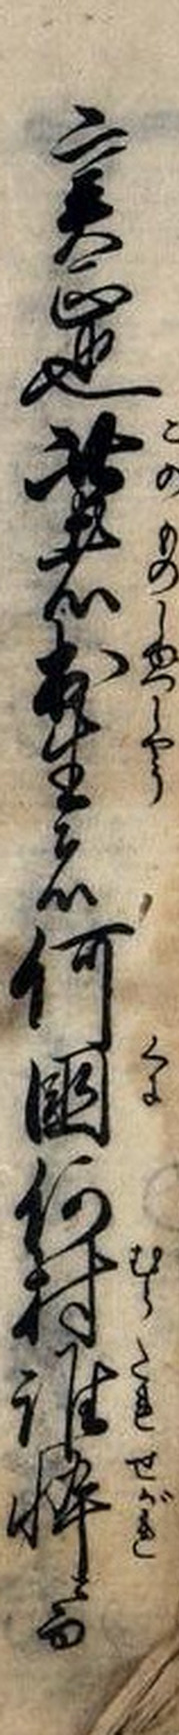実正也此者出生者何國何村誰忰に而
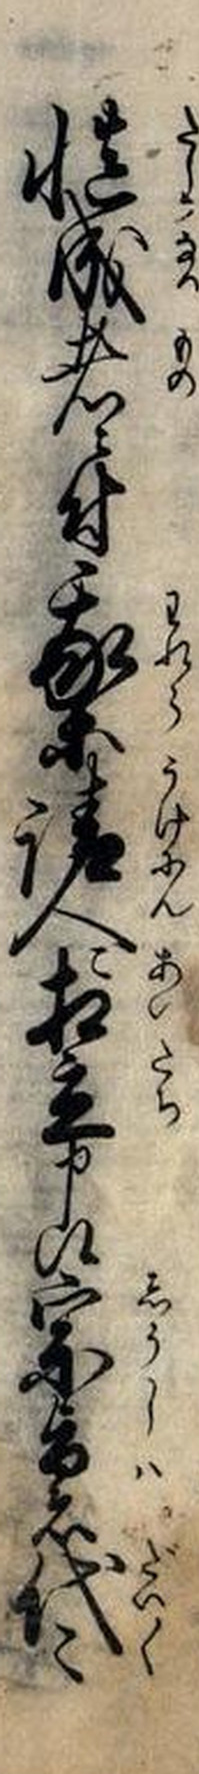慥成者に付我等請人に相立申候宗旨者代々
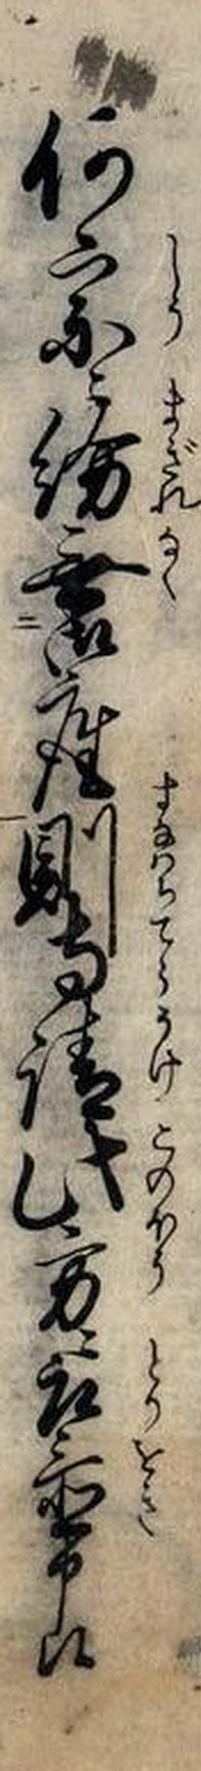何宗に紛無御座則寺請此方に取置申候
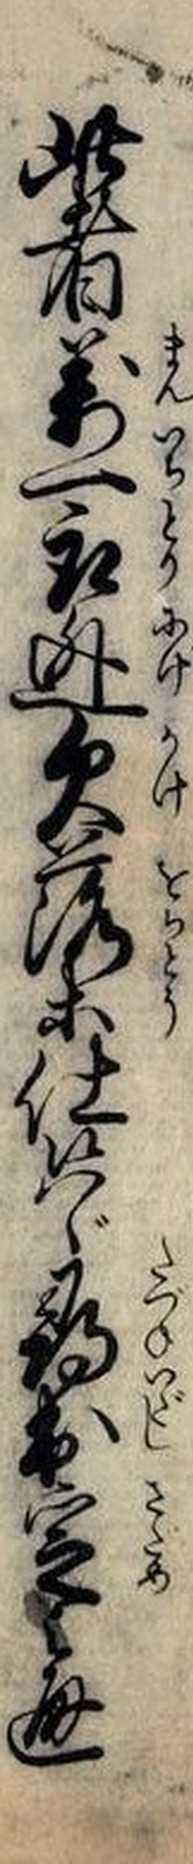此者萬一取逃欠落等仕候はゞ尋出定之通
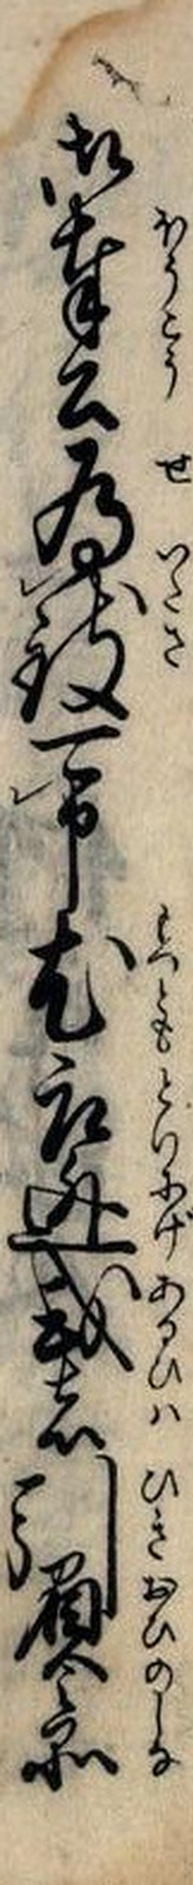御奉公為致可申尤取逃或者引負之品
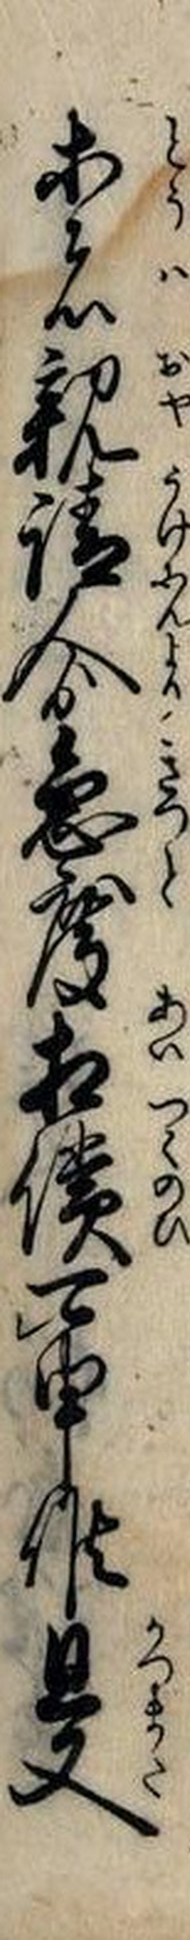等者親請人ゟ急度相償可申候且又
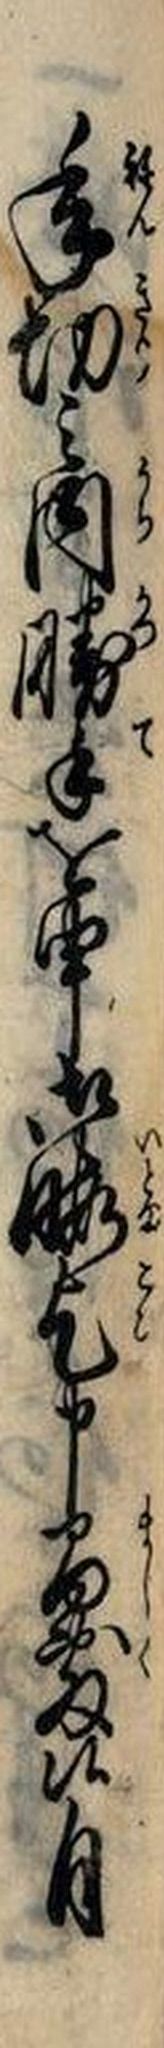年切之内勝手を申御暇乞申宜敷候自
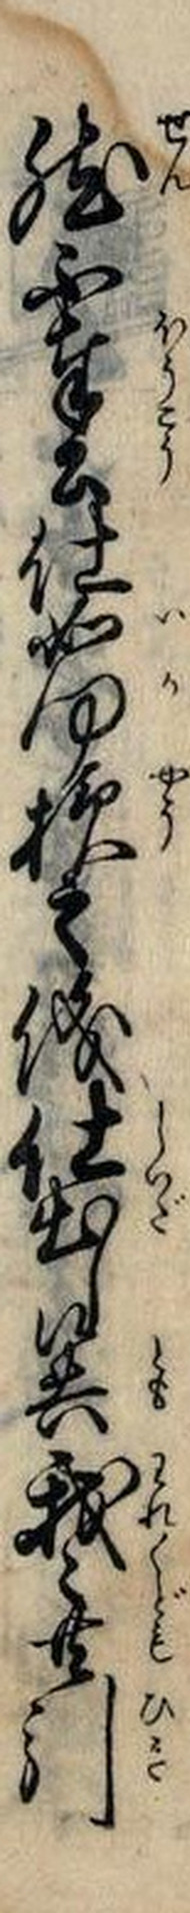然不奉公仕如何様之儀仕出し候共我々共引
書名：大成用文章（往来物）
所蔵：福井県文書館 Fukui Prefectural Archives
